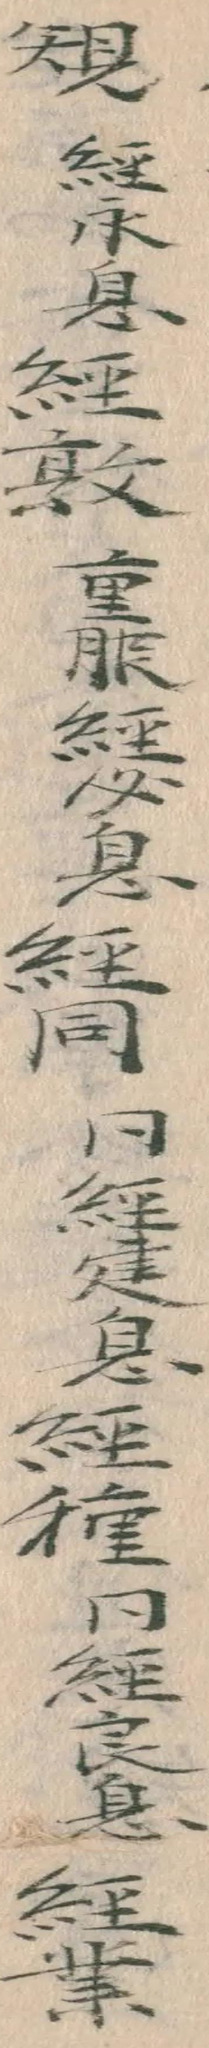規経永息経敦重服経必息経同同経建息経種同経良息経業
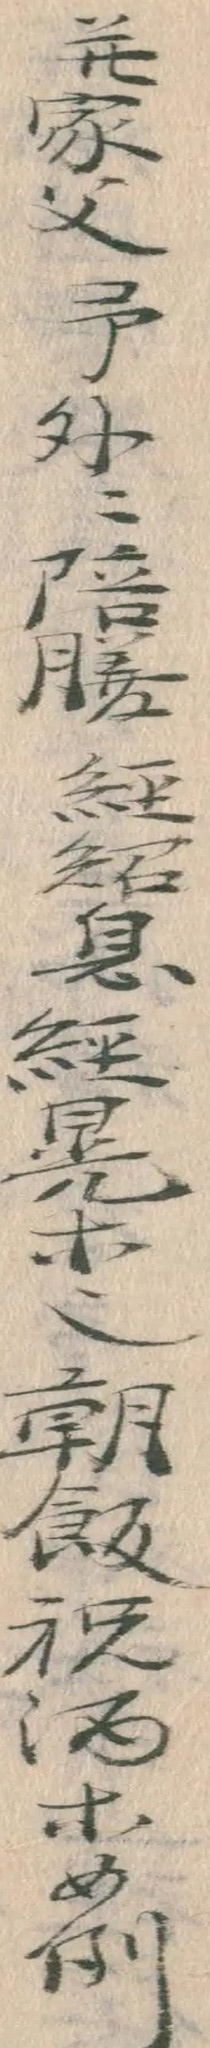并家父予外ニ陪膳経紹息経晃等也朝飯祝酒等如例
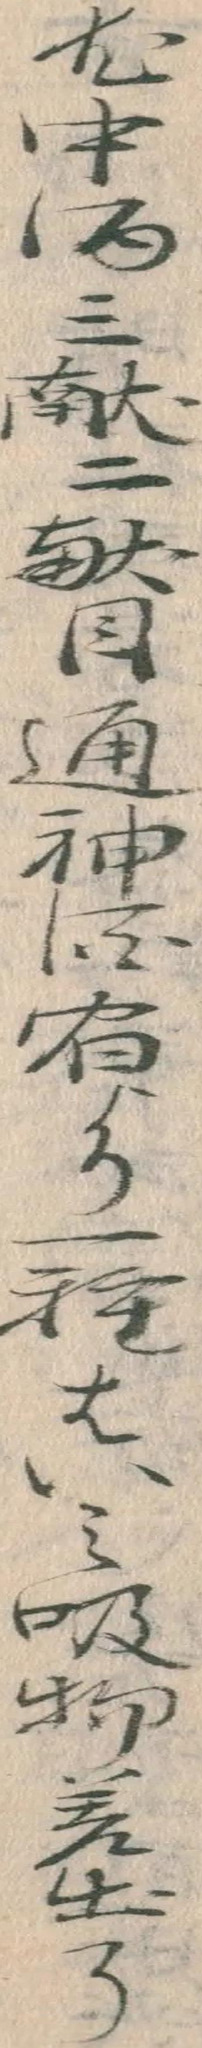尤中酒三献二献目通神酒宿より一種はい之吸物差出了
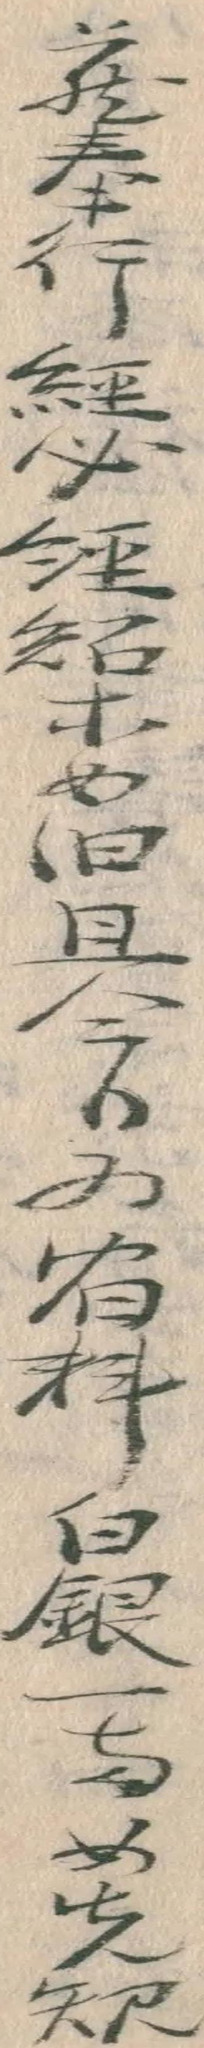蔵奉行経必経紹等如旧且今日為宿科白銀一両如先規
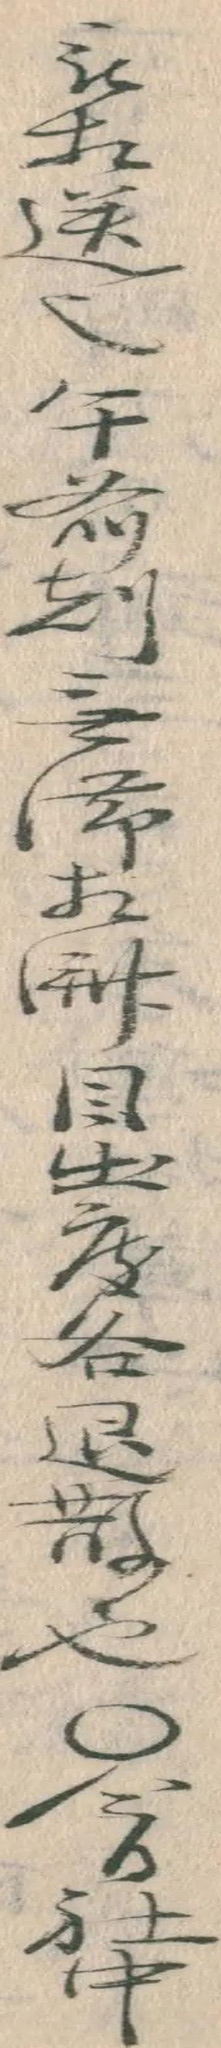被相送也午前刻無滞相済目出度各退散也○今日社中
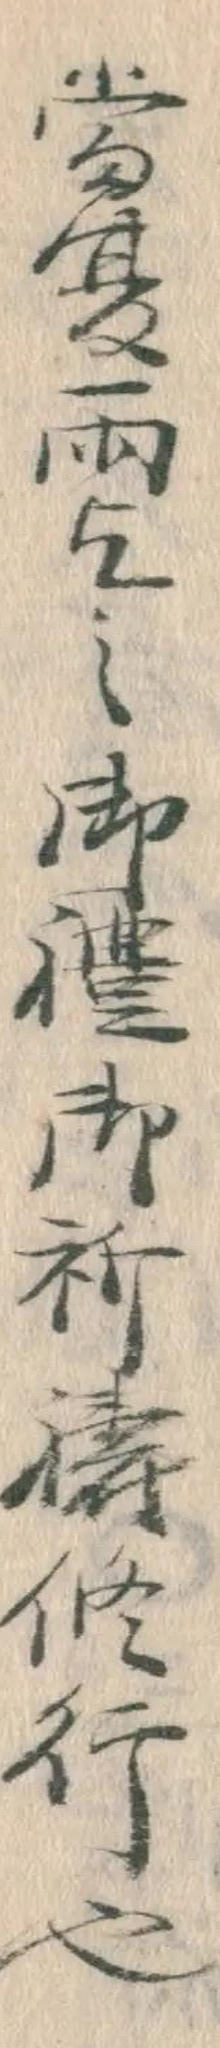当夏雨乞之御礼御祈祷修行也
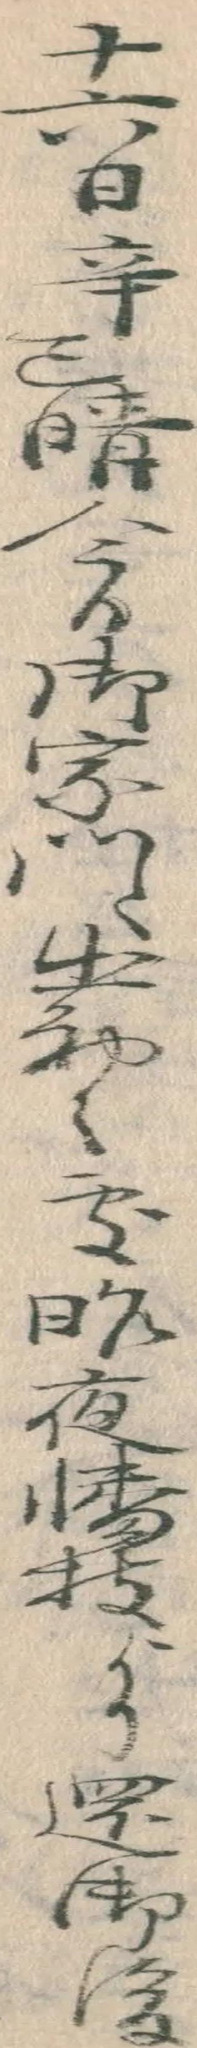十六日辛巳晴今日御家門へ出勤之処昨夜幡枝より還御後
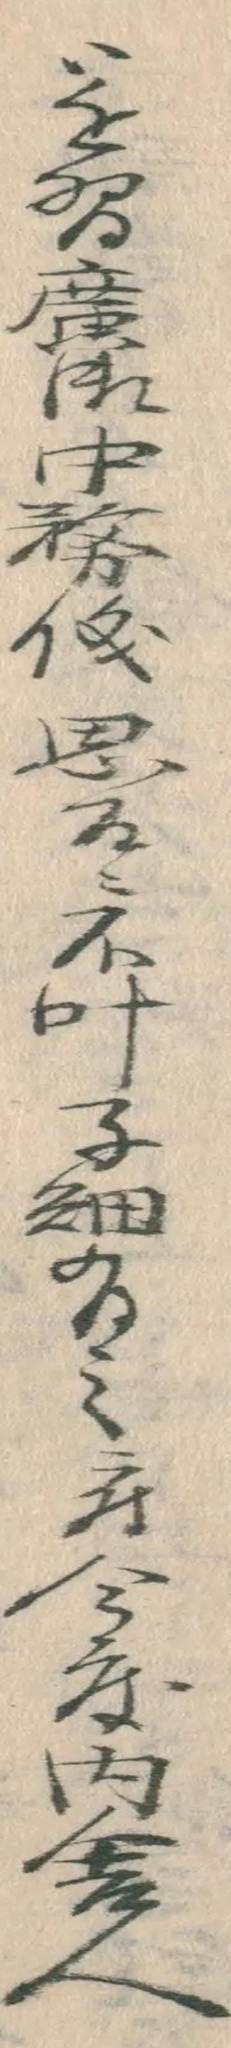御近習広瀬中務儀思召に不叶子細有之に付今度内舎人
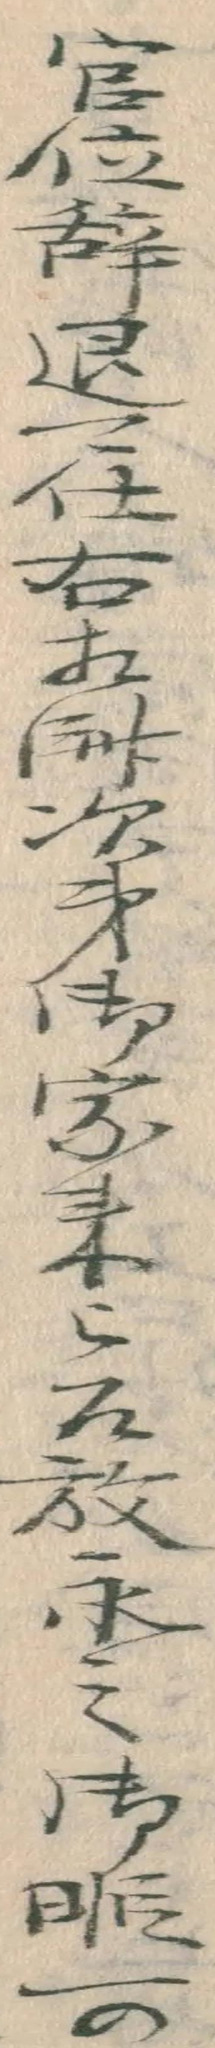官位辞退可仕右相済次第御家来被召放永之御暇可
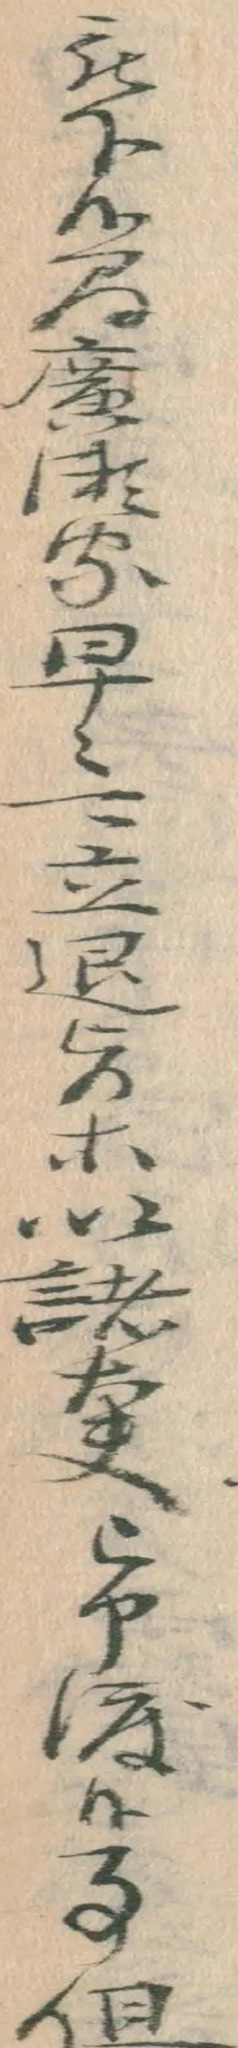被下候間広瀬家早々可立退旨等以諸大夫被申渡候事但

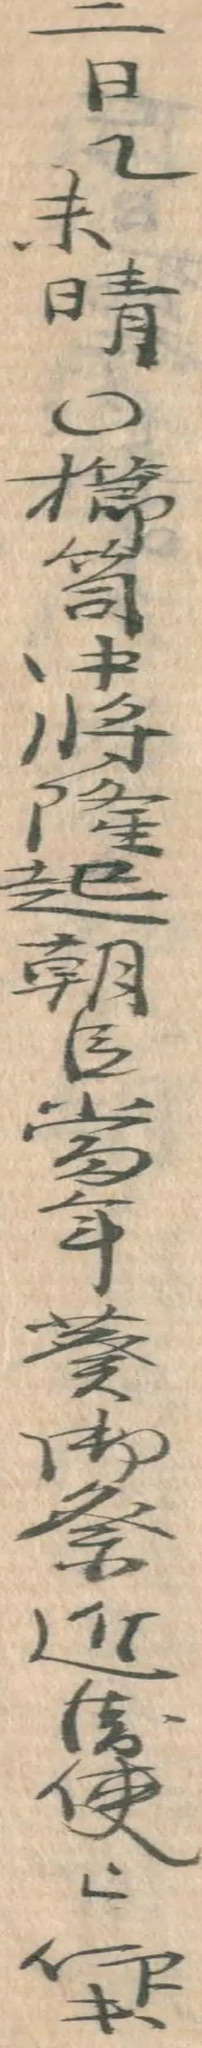二日乙未晴〇櫛笥中将隆起朝臣当年葵御祭近衛使被仰出
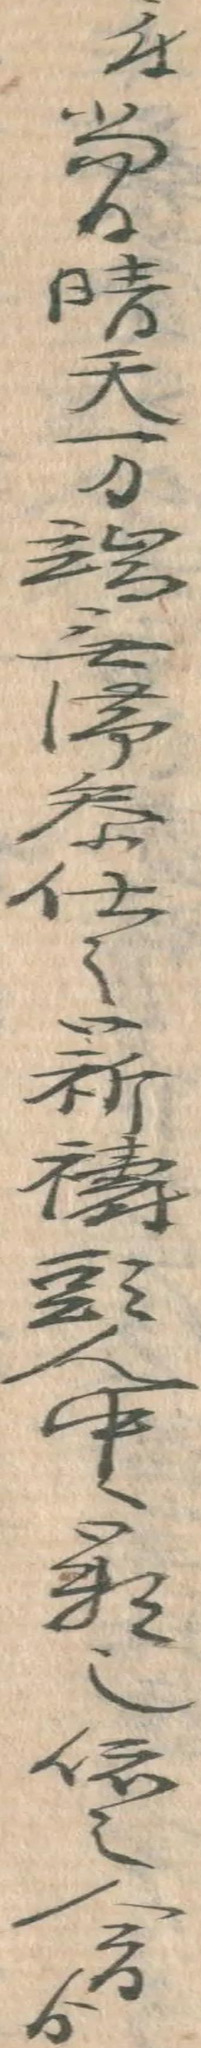ニ付当日晴天万端無滞参仕之御祈祷頭人中へ御頼也依之今日ゟ
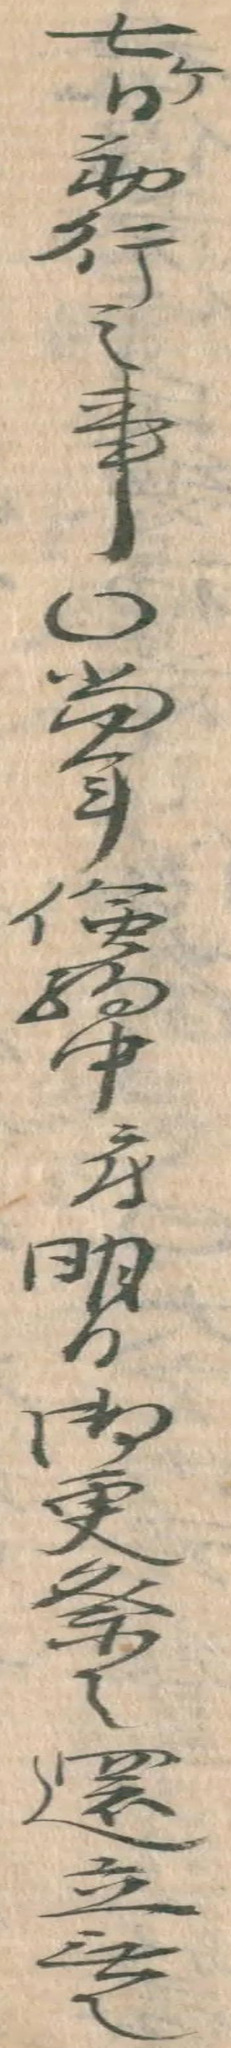七ケ日勤行之事〇当年倹約中ニ付明日御更祭之還立無之
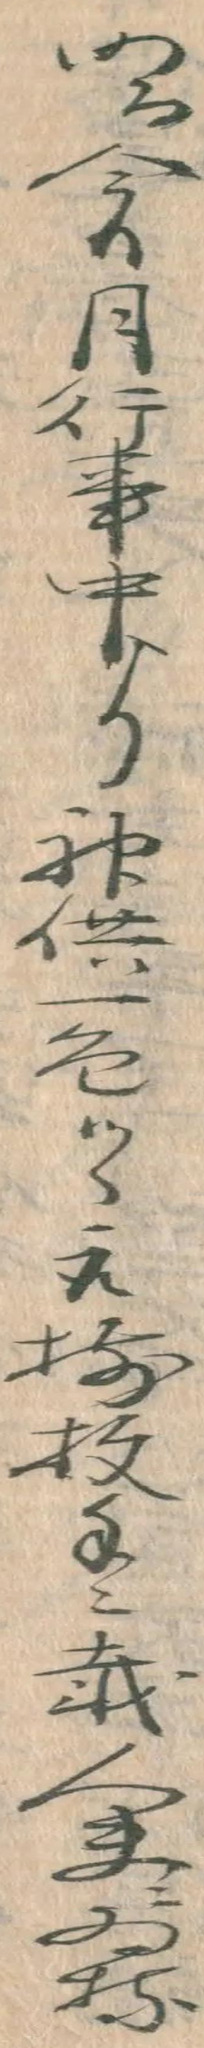仍而今日月行事中より神具一色ツゝ取揃枚手ニ載人夫ニ為持
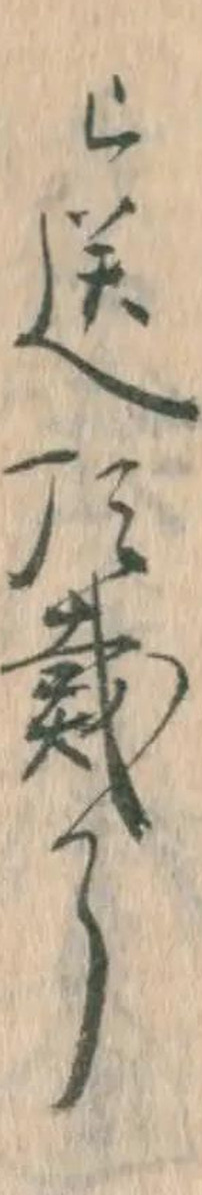被送頂戴了
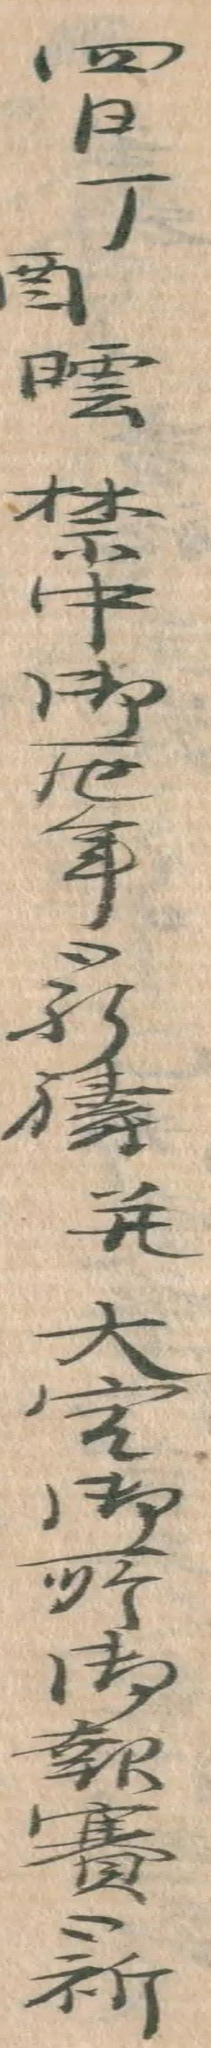四日丁酉曇禁中御厄年御祈祷並大宮御所御報賽御祈
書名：賀茂社記録. 第64冊
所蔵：国立国会図書館 National Diet Library, JAPAN
